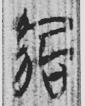紀
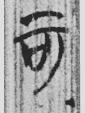可
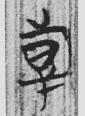幹（晉）
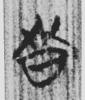冬（冬）
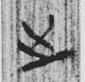之
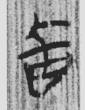旨（祁）
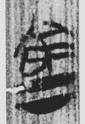倉
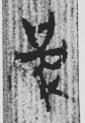喿（巢）
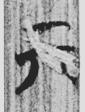亓
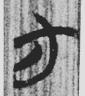方
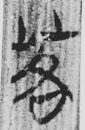茖（落）
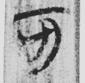可（兮）
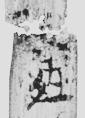{鳥朋土}鳳
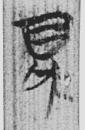鳥
